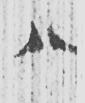八
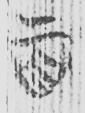百
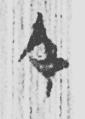千
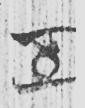五
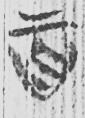百
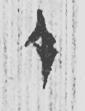千
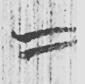二
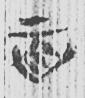百
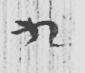九
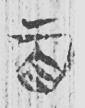百
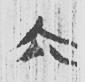六
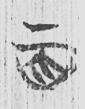百
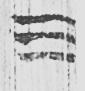三
